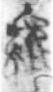○（紕）
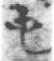屯
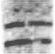二
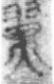翼
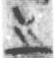之
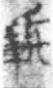○（鎋）
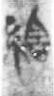○（組）
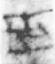珥
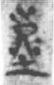填
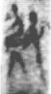○（紛）
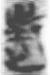○（衡）
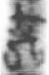戹（軛）
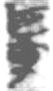○（緅）
